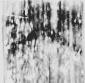大
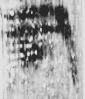司
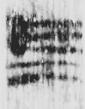馬
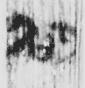卲
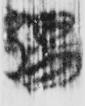昜（陽）
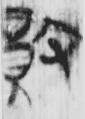敗
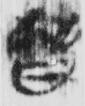晋
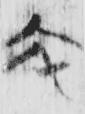帀（師）
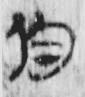於
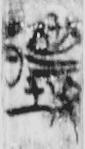○（襄）
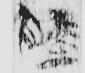陵
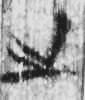之
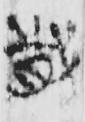歲（歲）
